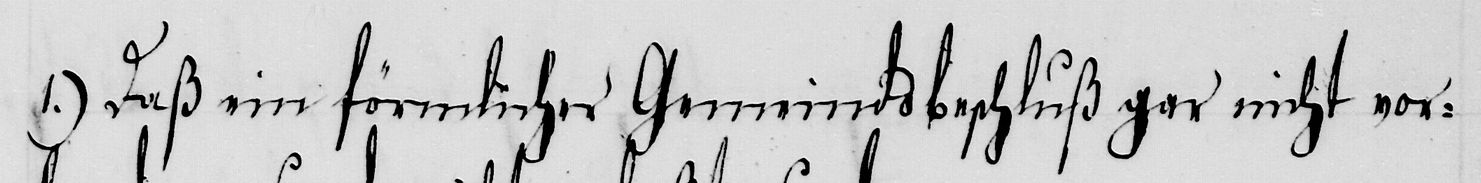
1.) Daß ein förmlicher Gemeindsbeschluß gar nicht vor¬
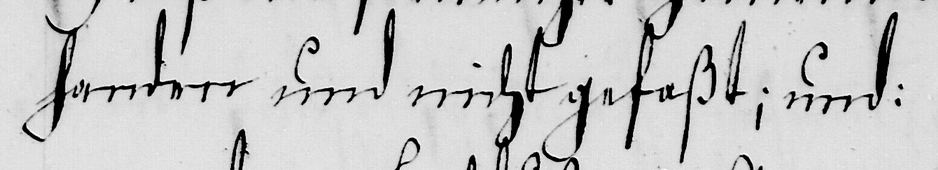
handen und nicht gefaßt; und:
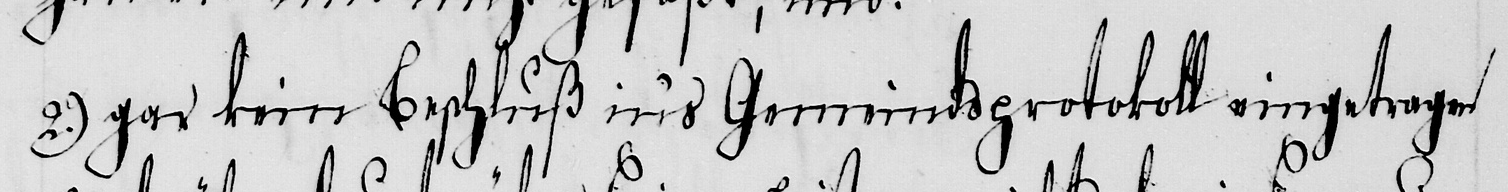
2.) gar kein Beschluß ins Gemeindsprotokoll eingetragen
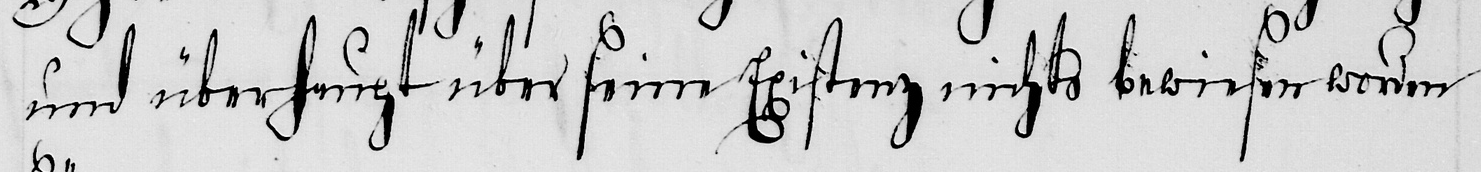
und überhaupt über seine Existenz nichts bewiesen worden
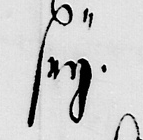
sey.
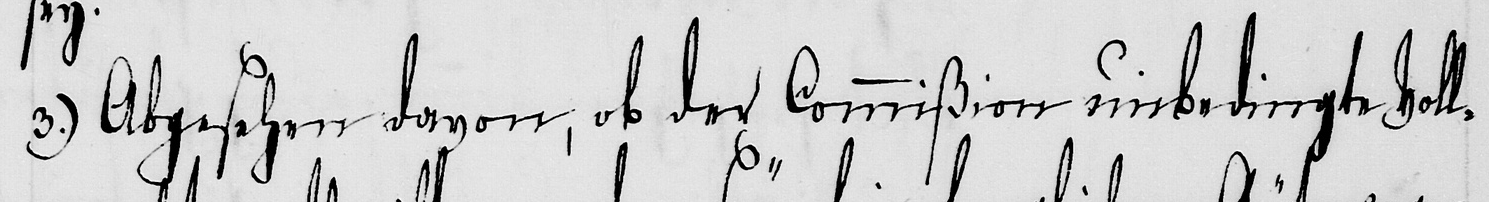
3.) Abgesehen davon, ob der Commißion unbedingte Vol¬
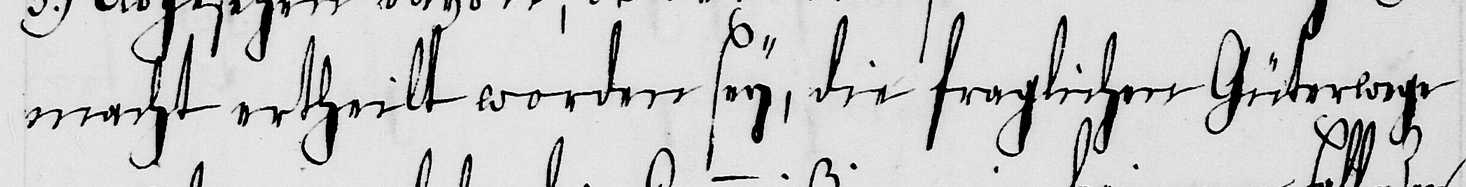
lmacht ertheilt worden sey, die fraglichen Güterwege
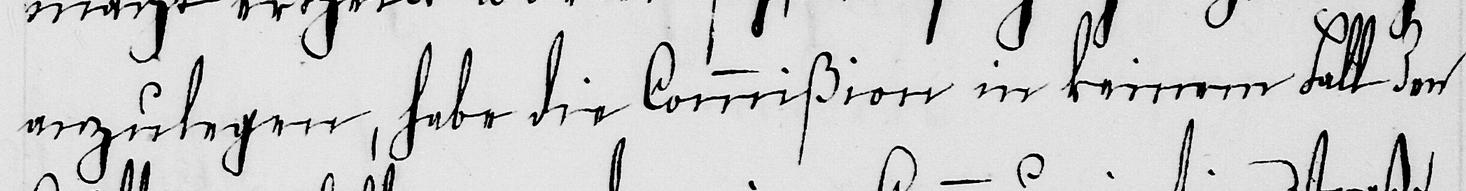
anzulegen, habe die Commißion in keinem Fall den
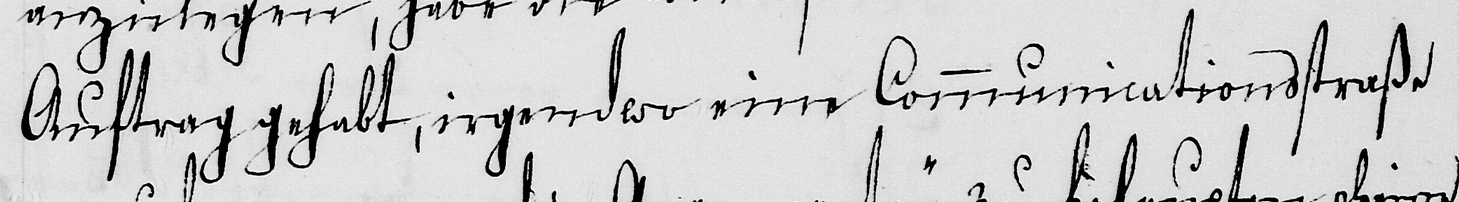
Auftrag gehabt, irgendwo eine Communicationsstraße
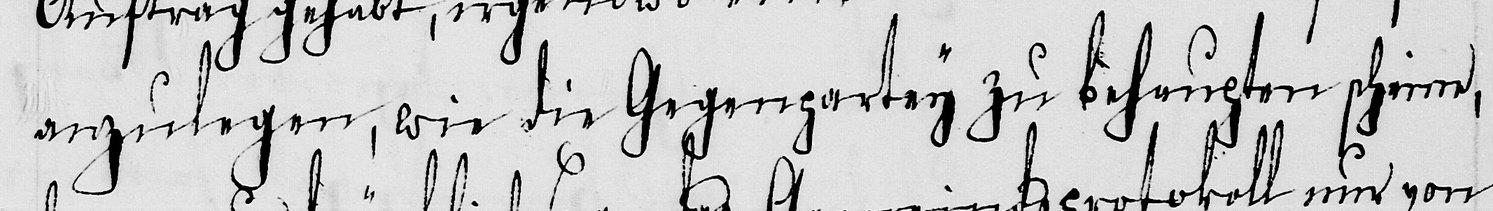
anzulegen, wie die Gegenpartey zu behaupten scheine,
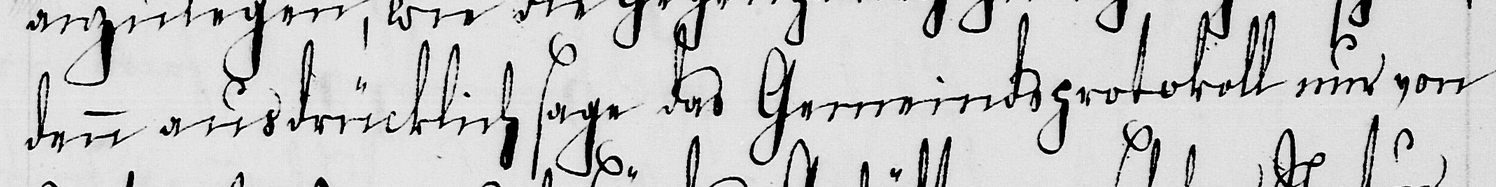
denn ausdrücklich sage das Gemeindsprotokoll nur von
